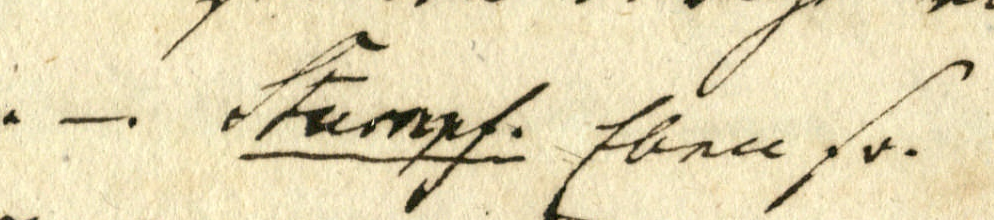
Stumpf. Eben so.
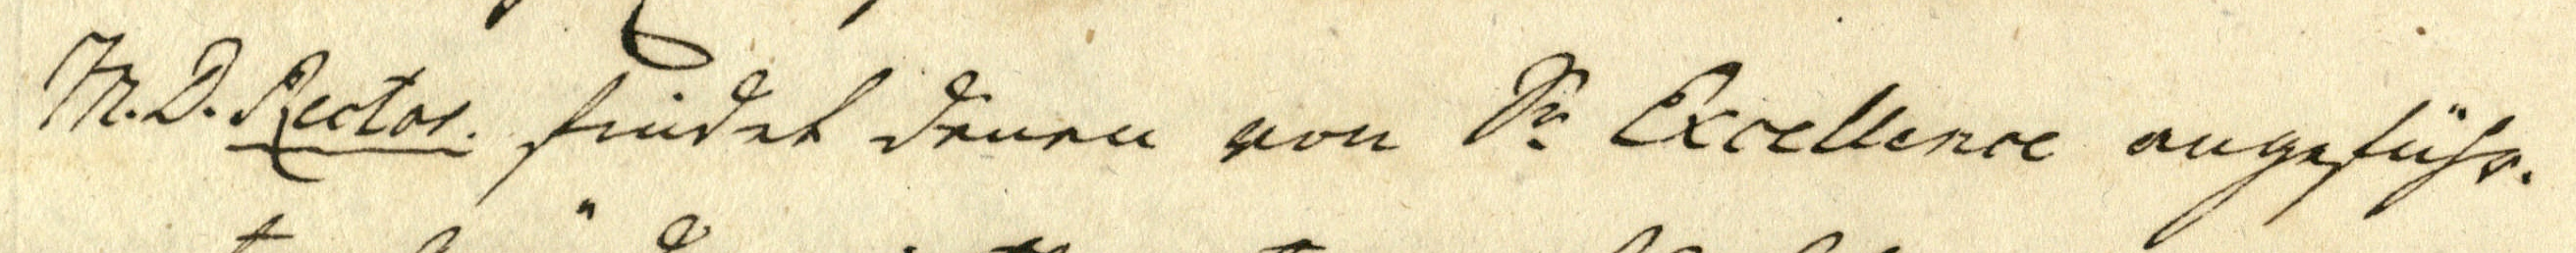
M. D. Rector. findet denen von Sr. Excellence angeführ¬
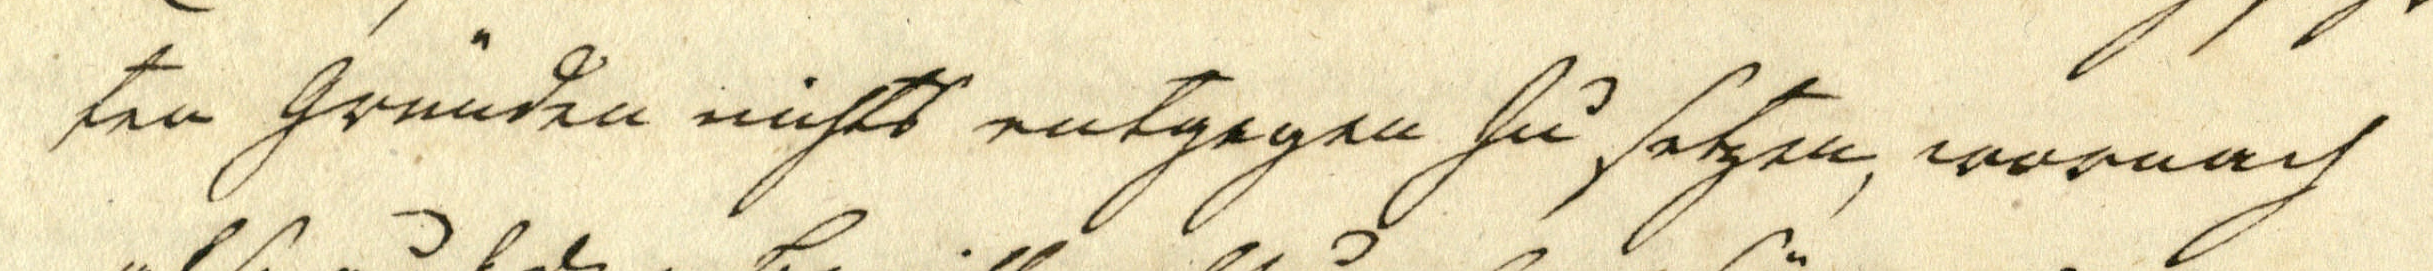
ten Gründen nichts entgegen zu setzen, wornach
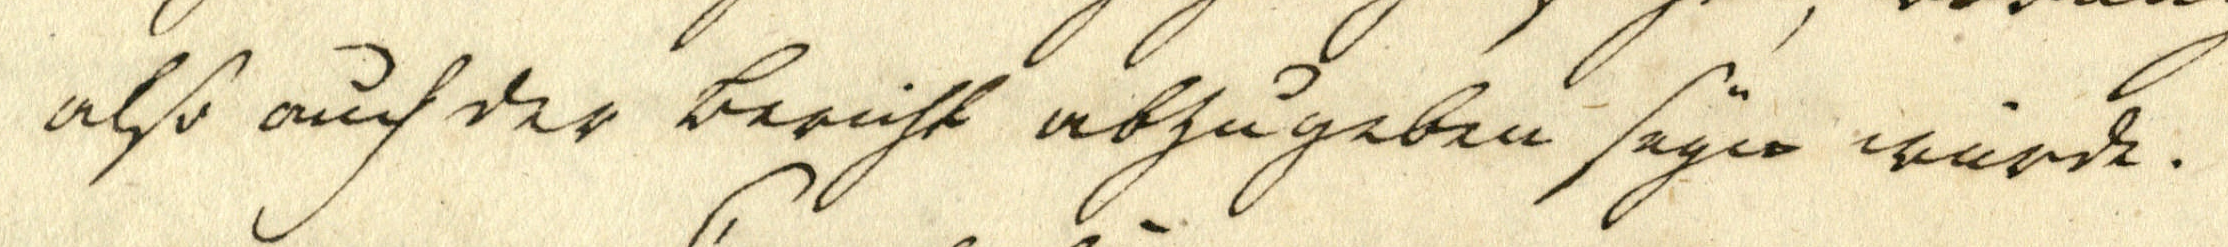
also auch der Bericht abzugeben seÿn würde.
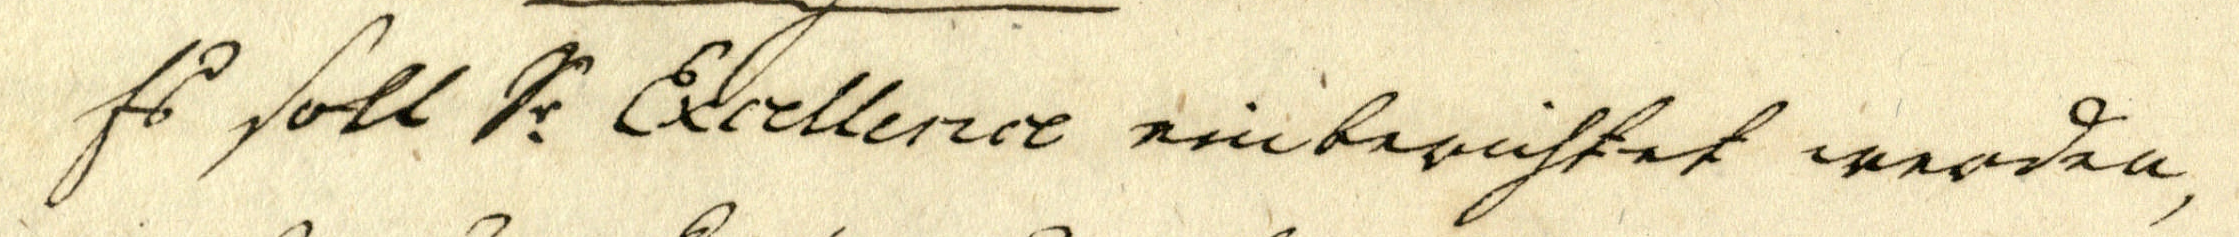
Es soll Sr. Excellence einberichtet werden,
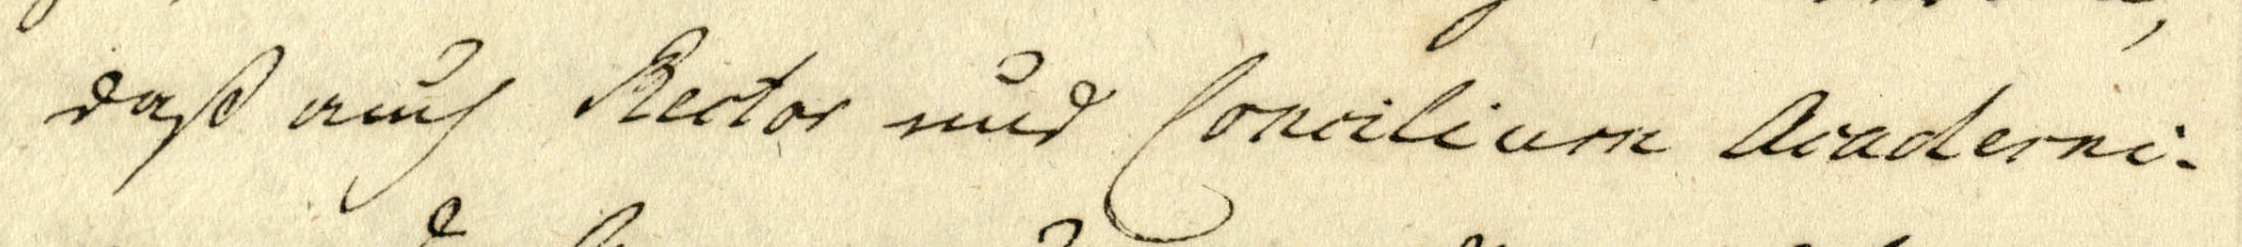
daß auch Rector und Concilium Academi¬
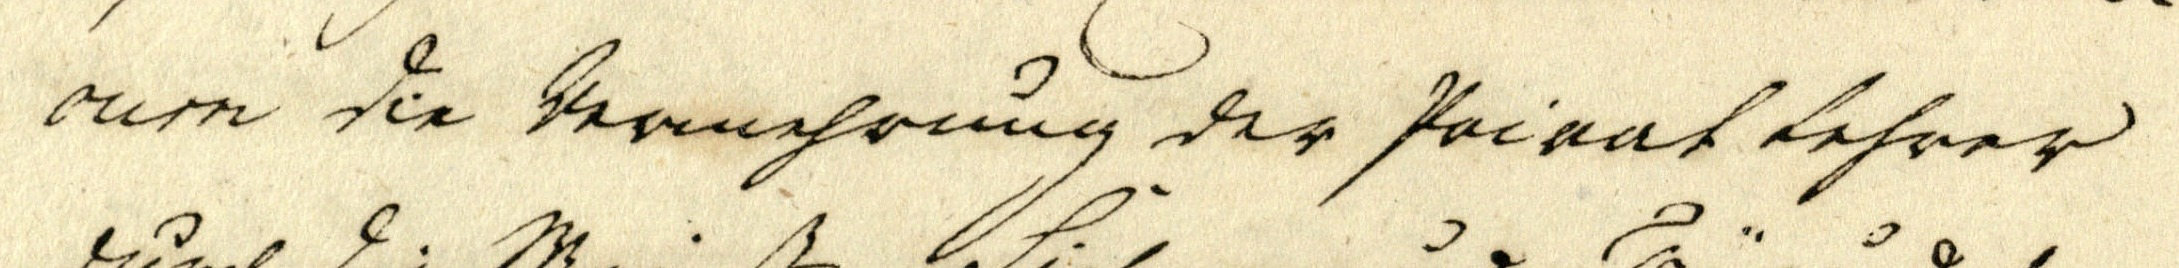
cum die Vermehrung der Privat lehrer
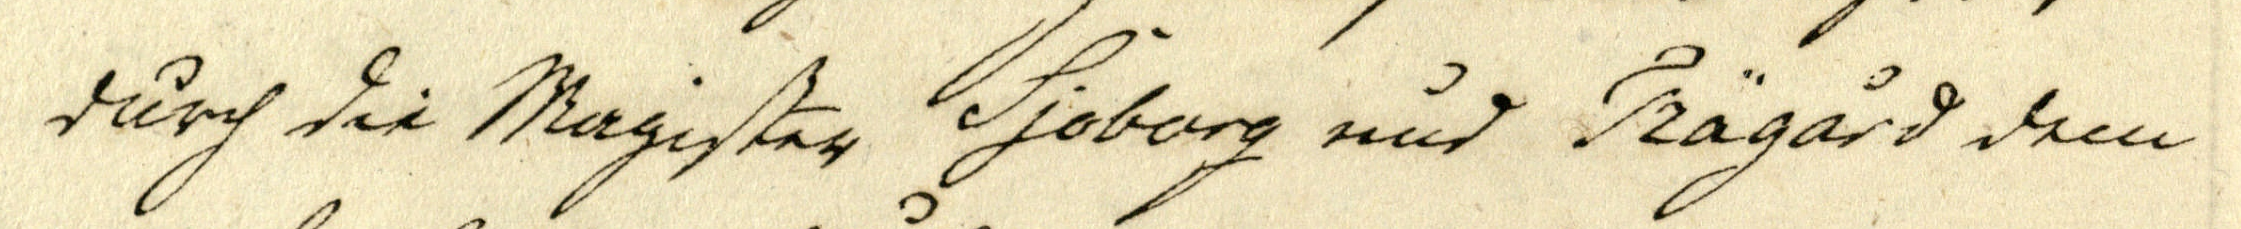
durch die Magister Sjöborg und Trägård dem
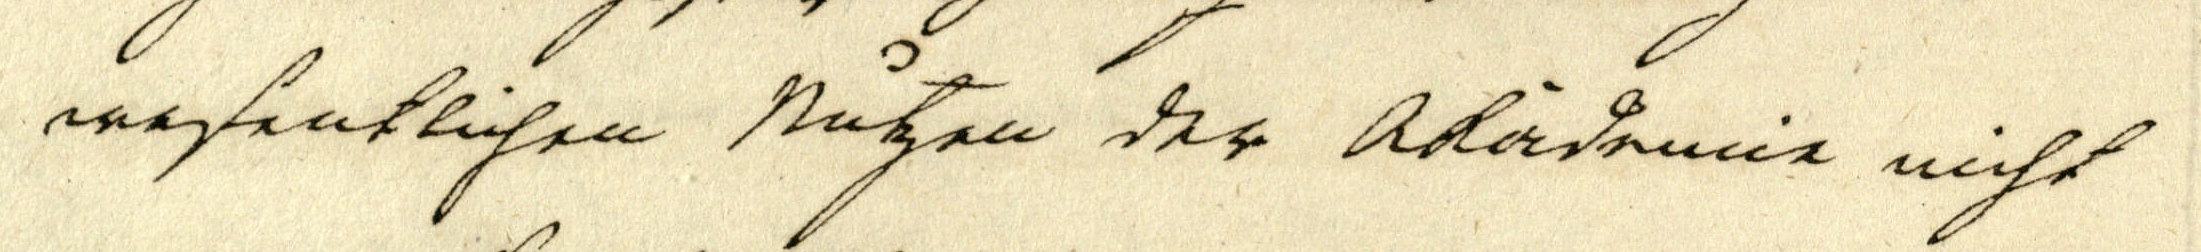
wesentlichen Nutzen der Akademie nicht
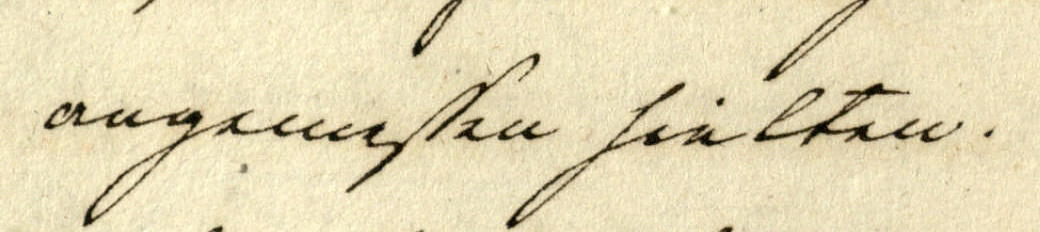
angemessen hielten.
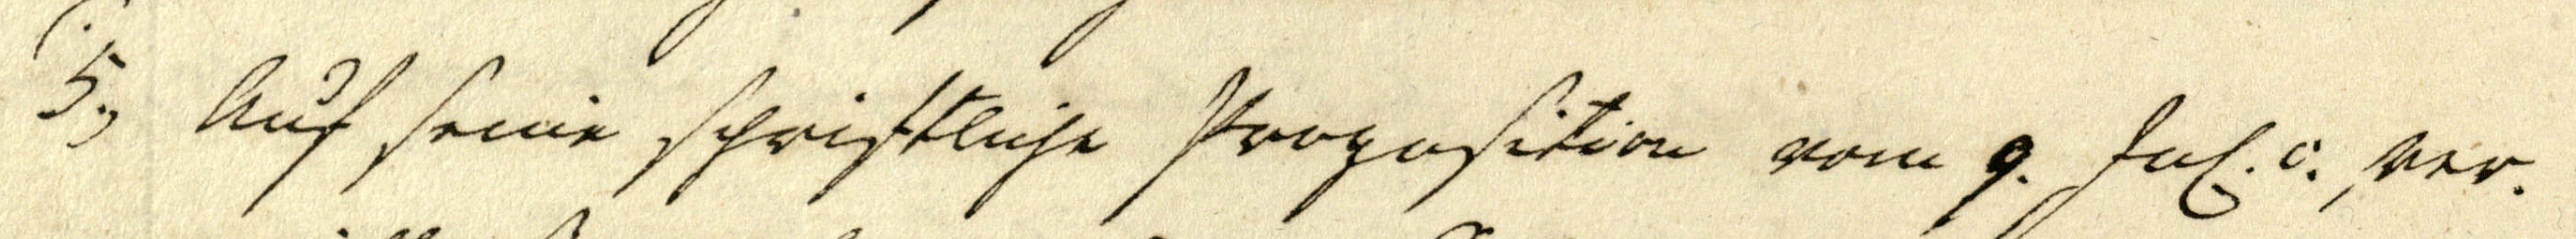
5., Auf seine schriftliche Proposition vom 9. Jul. c. ver¬
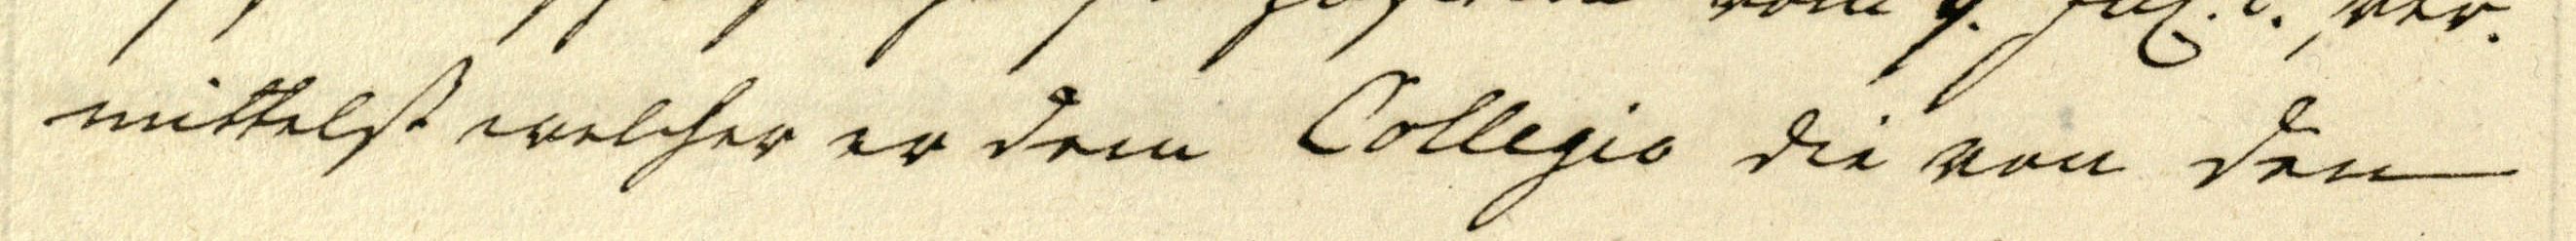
mittelst welcher er dem Collegio die von den
